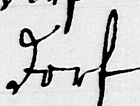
Dorf
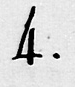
4.
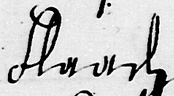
Flaach
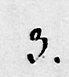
3.
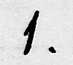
1.
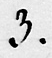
3.
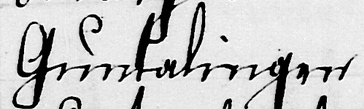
Guntalingen
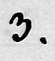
3.
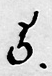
5.
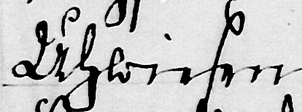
Uhwiesen
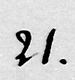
21.
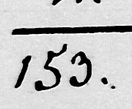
153.
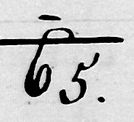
65.
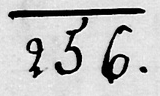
256.
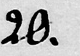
20.
